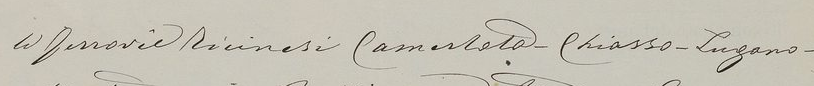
le ferrrovie ticinesiCamerlata–Chiasso–Lugano–
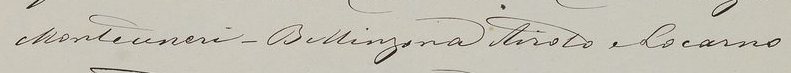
Monteceneri–Bellinzona–Airolo e Locarno
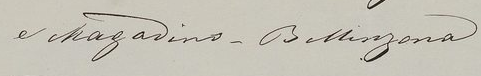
e Magadino–Bellinzona.»
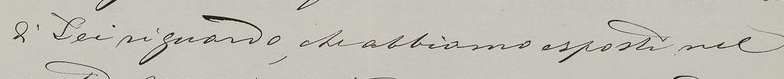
di Lei riguardo, che abbiamo esposti nel
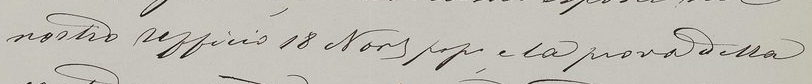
nostro refficio 18 Nov. pss, e la prova della
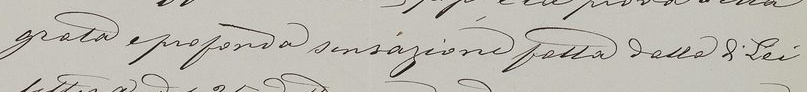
grata e profonda sensazione fatta dalla di Lei
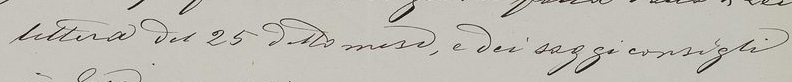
lettera del 25 della mese, e dei saggi consigli
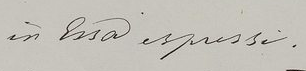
in Essa espressi.
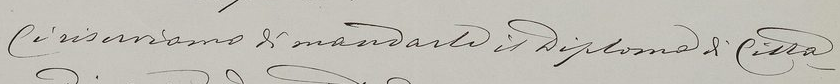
Ci riserviamo di mandarle il Diploma di Citta-
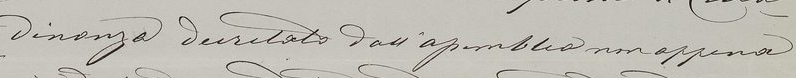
dinanza decretato dall'assemblea non appena
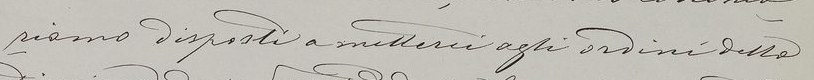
riamo disposti a metterci agli ordini della
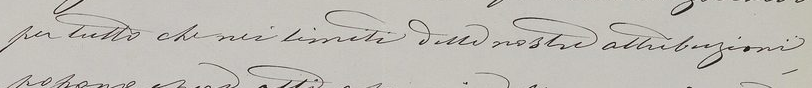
per tutto che nei limiti delle nostre attribuzioni
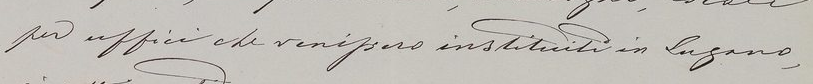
per uffici che venissero instituiti in Lugano,
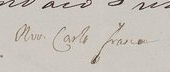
Avv Carlo Frasca
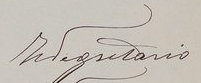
Segretario
